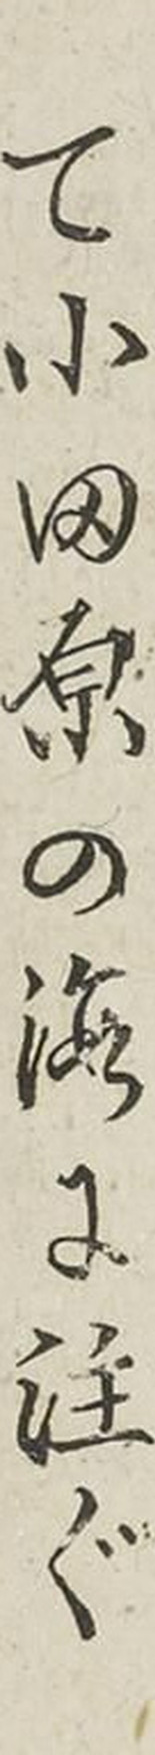て小田原の海に注ぐ

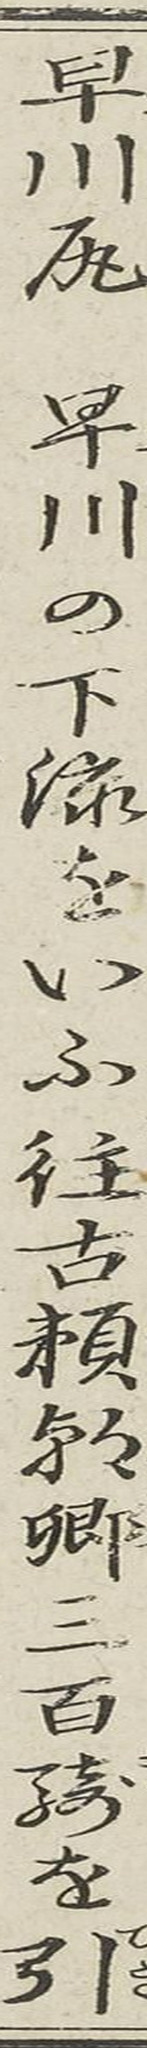早川尻早川の下流をいふ往古頼朝卿三百騎を引
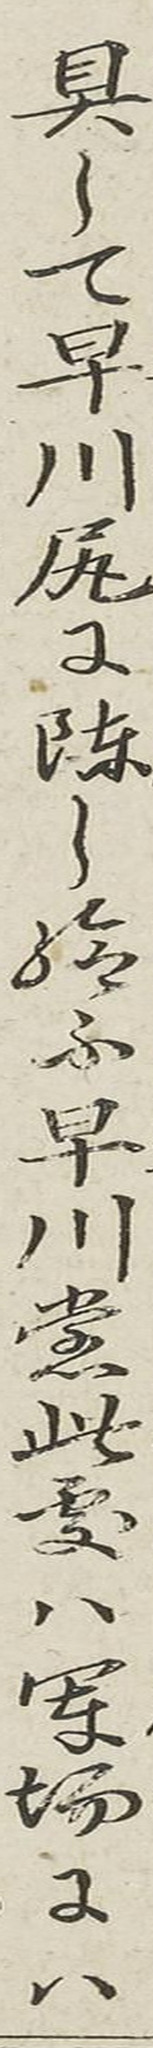具して早川尻に陣し給ふ早川党此処は軍場には
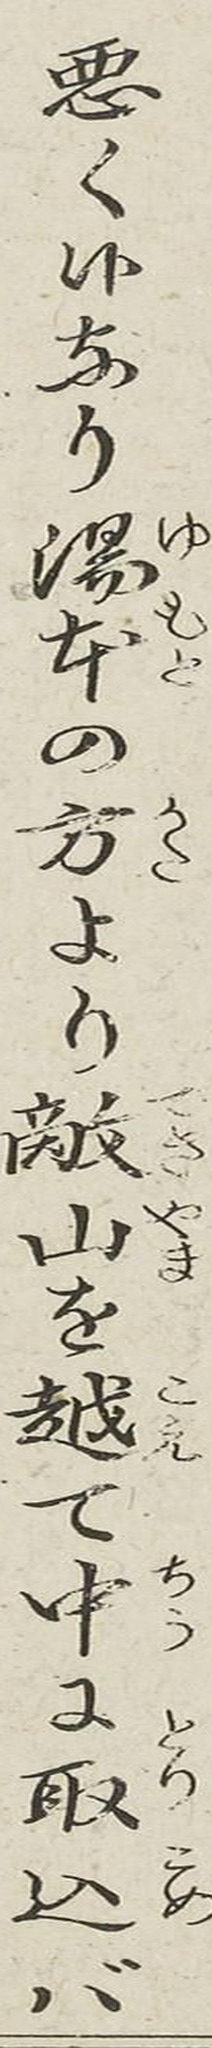悪く候なり湯本の方より敵山を越て中に取込ば
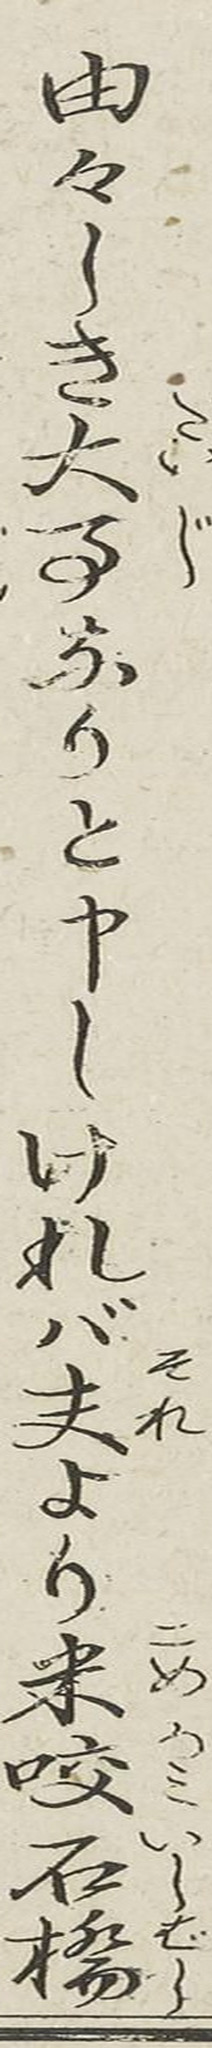由々しき大事なりと申しければ夫より米咬石橋
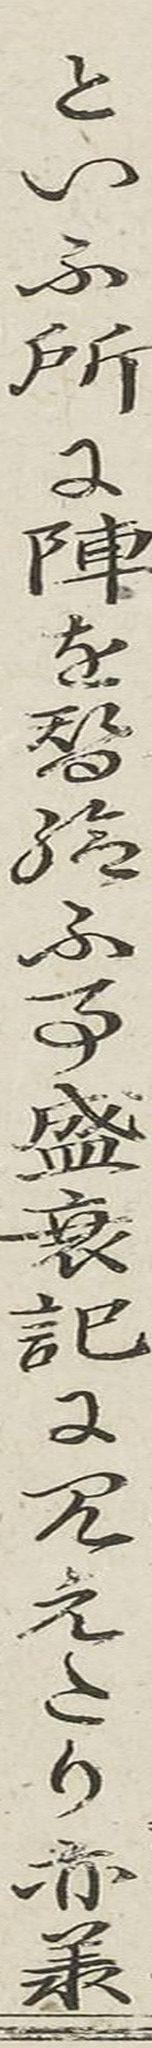といふ所に陣を替給ふ事盛衰記に見えたり亦承
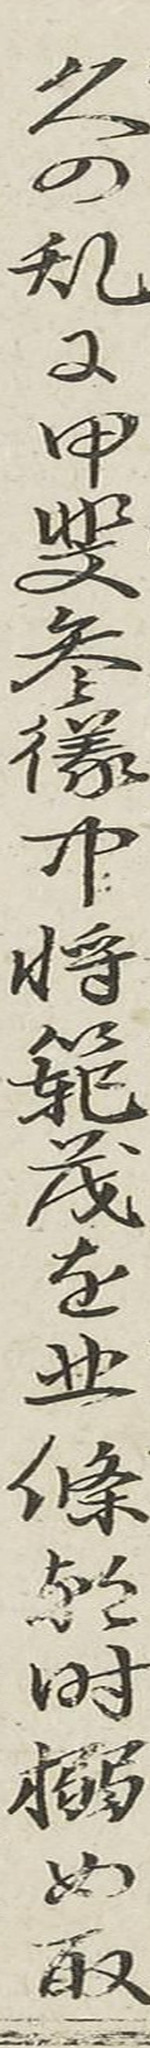久の乱に甲斐参議中将範茂を北條朝時搦め取
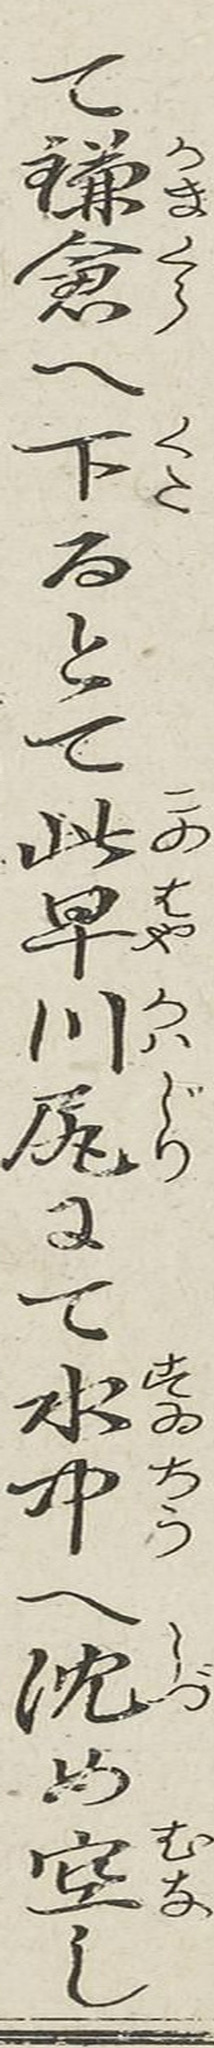て鎌倉へ下るとて此早川尻にて水中へ沈め空し
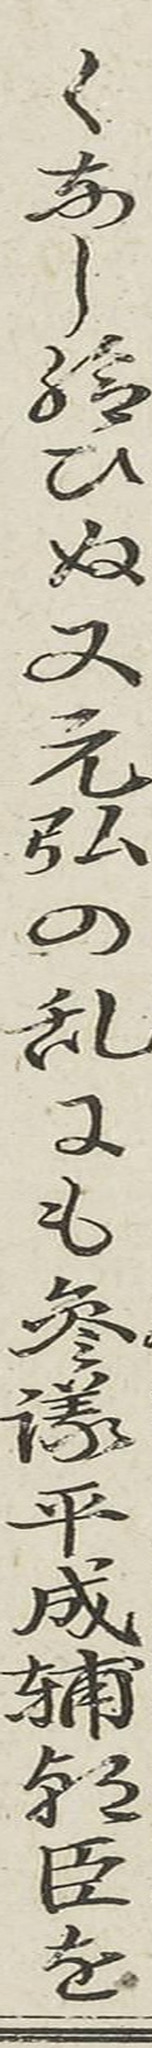くなし給ひぬ又元弘の乱にも参議平成輔朝臣を
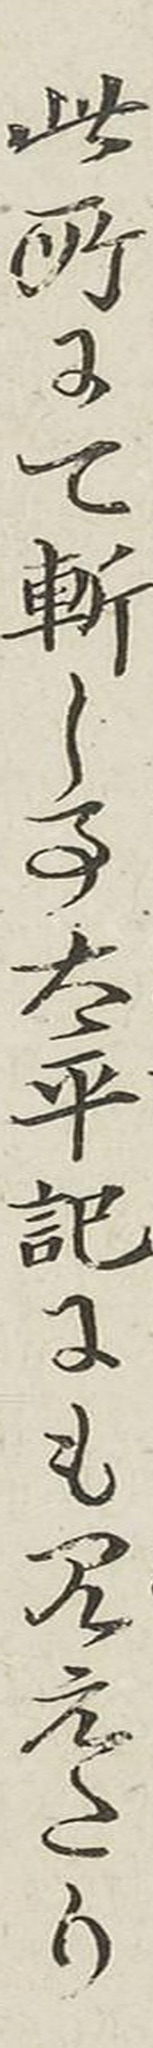此所にて斬し事太平記にも見えたり
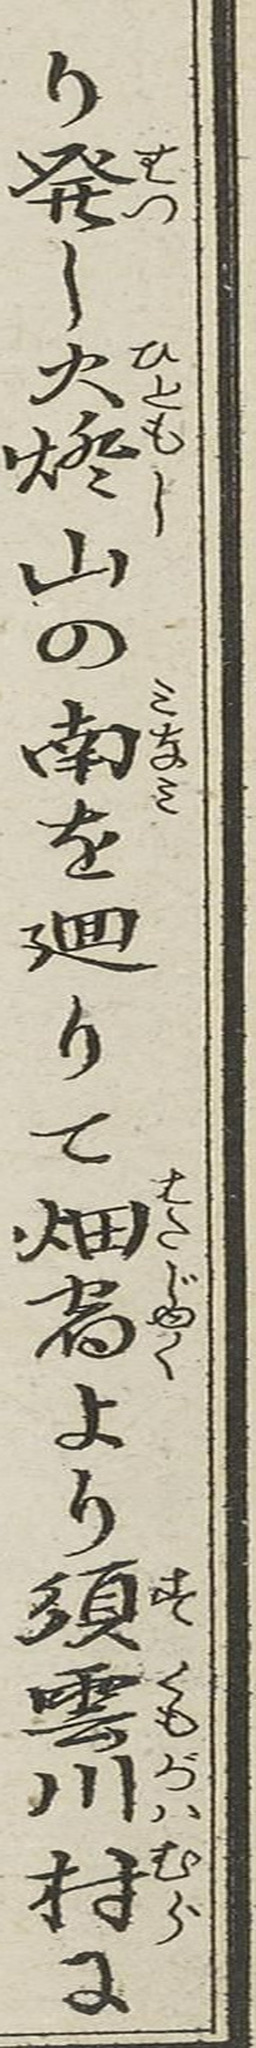り発し火燃山の南を廻りて畑宿より須雲川村に
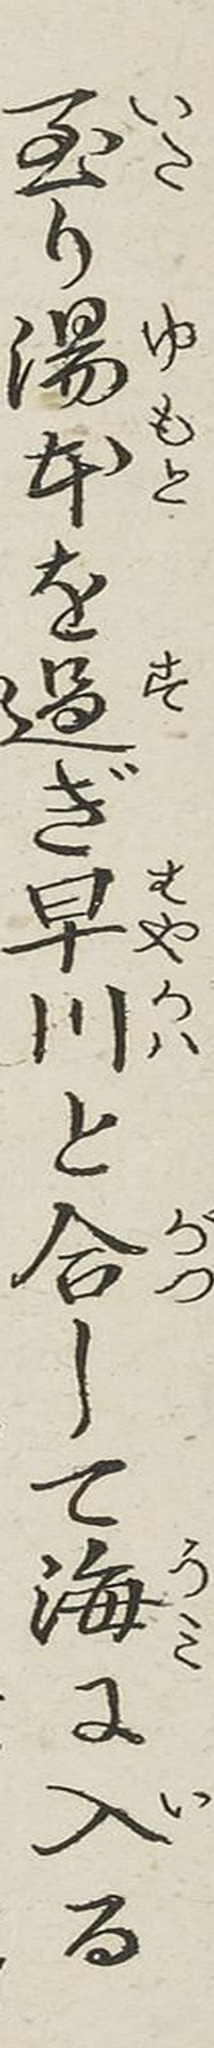至り湯本を過ぎ早川と合して海に入る
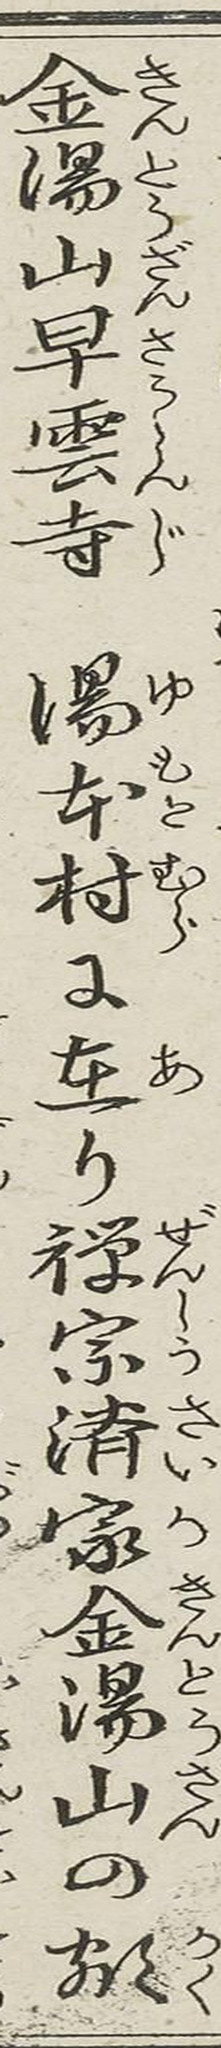金湯山早雲寺湯本村に在り禅宗済家金湯山の額
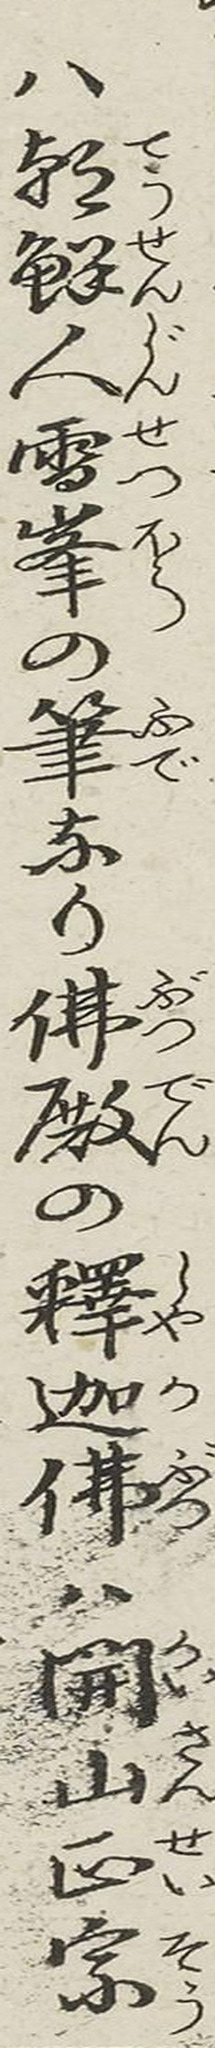は朝鮮人雪峰の筆なり仏殿の釈迦仏は開山正宗
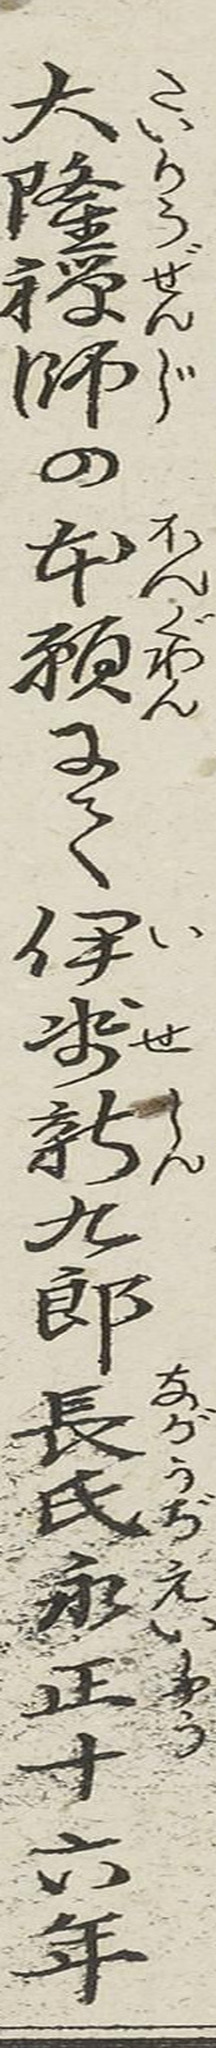大隆禅師の本願にて伊勢新九郎長氏永正十六年
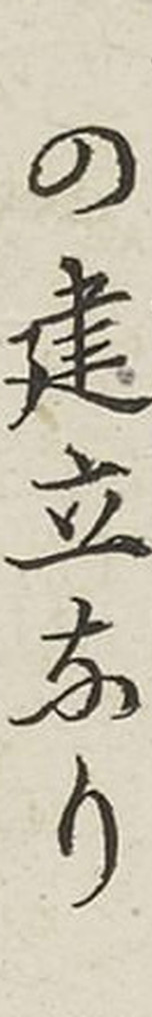の建立なり
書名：箱根温泉誌　全
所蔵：東京大学地震研究所図書室 Earthquake Research Institute Library, The University of Tokyo, JAPAN
